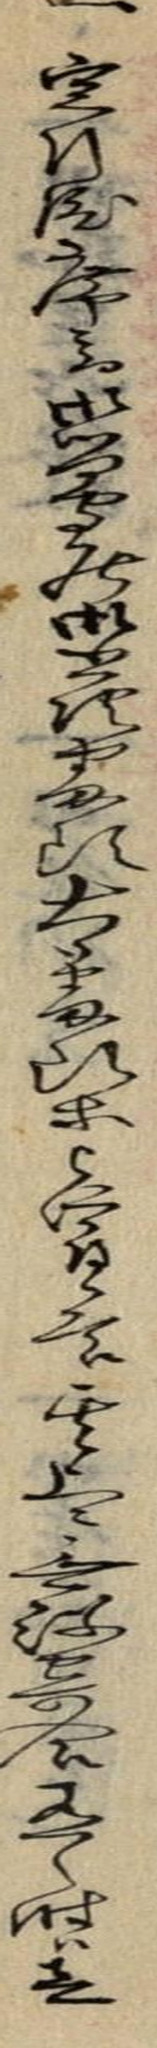一定引渡席に而御留守居御書院番頭大御番頭等被仰付候節其上に無役寄合有之時は壱
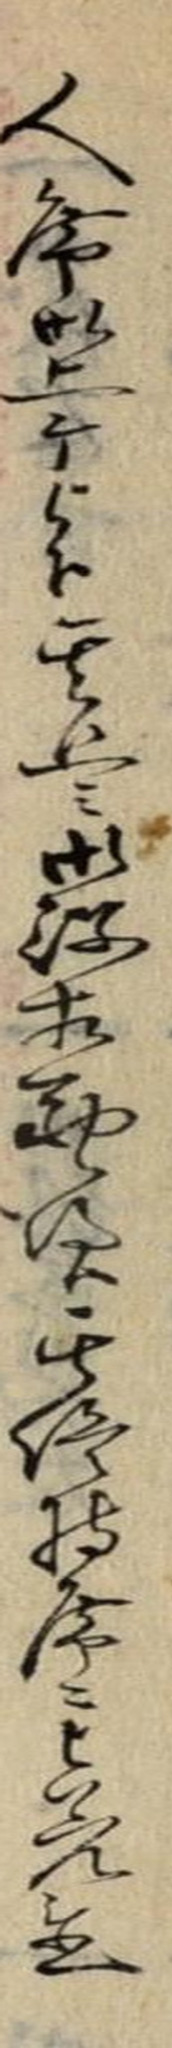人席御上ヶ被下其上ミ御役相勤候得は其侭持席に被差置
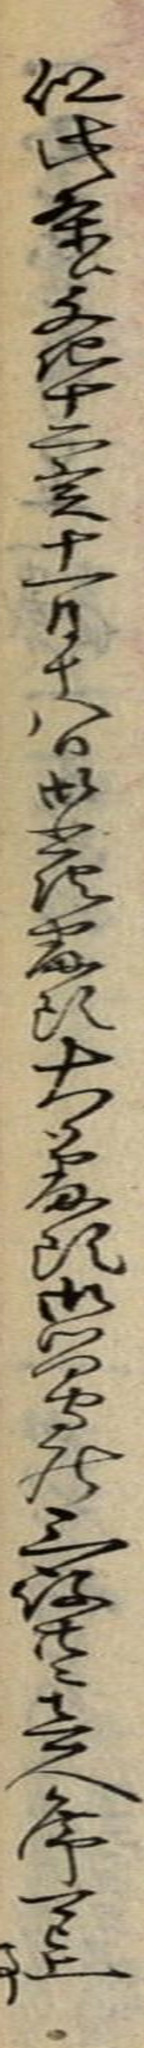但此条は文化十二亥十一月十八日御書院番頭大御番頭御留守居三役共壱人席可被上事
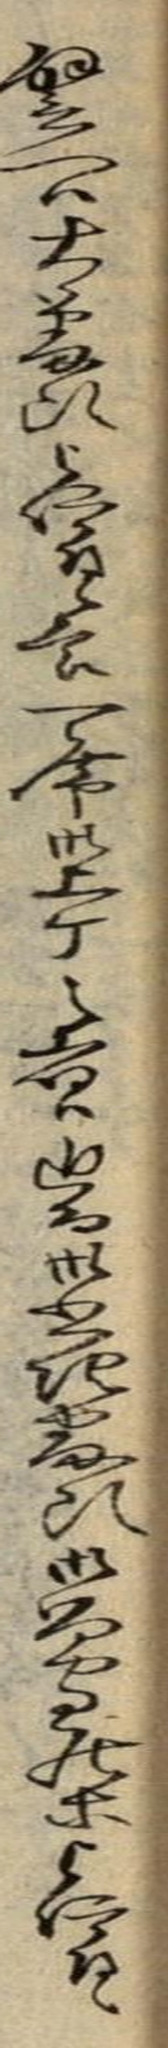譬へは大御番被仰付候節一席御上ヶ之者は追而御書院番頭御留守居等被仰付候
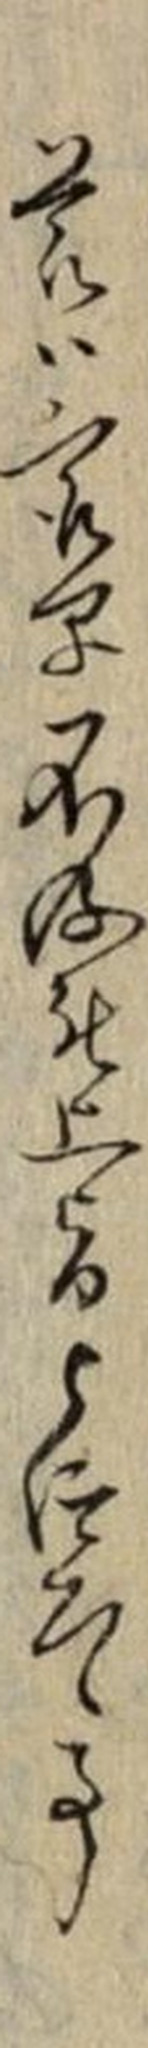節は最早不及被上候旨被仰出候事
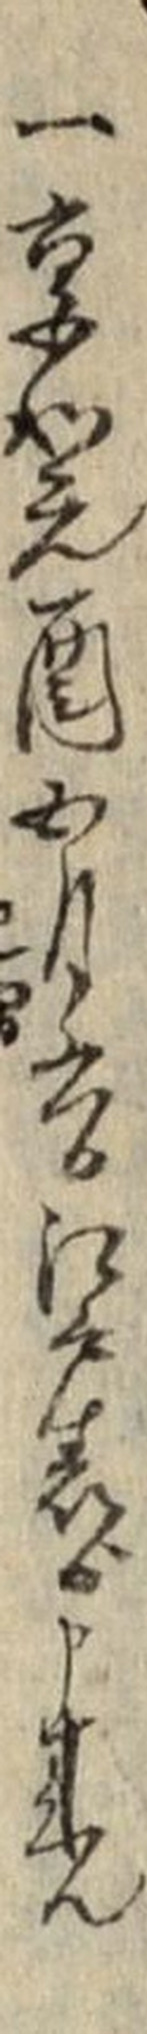一享和元酉五月六日江戸表ゟ申来ル
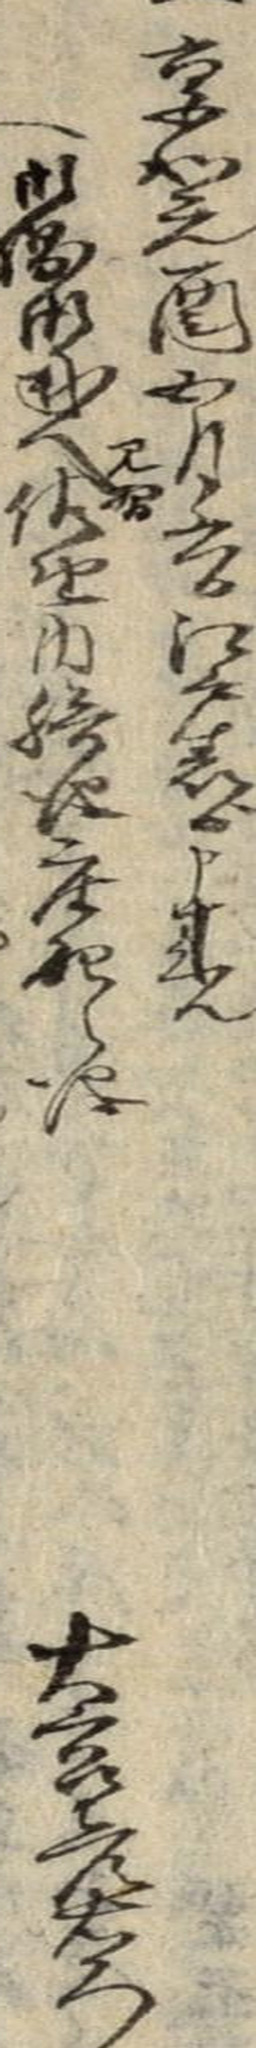御側御用人見習佐野内膳儀座配之儀大宮彦右衛門
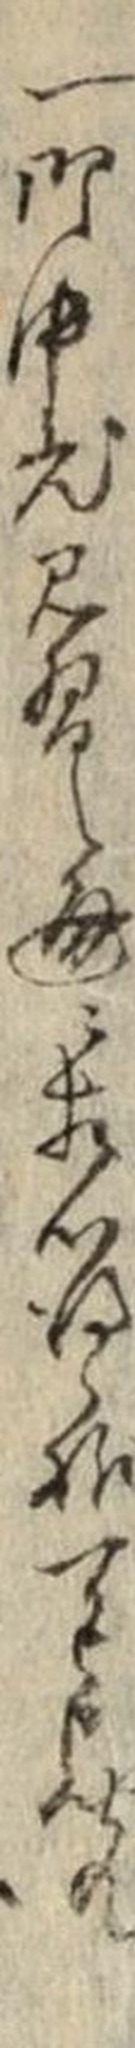御中老見習之通に相心得候様可被申聞候
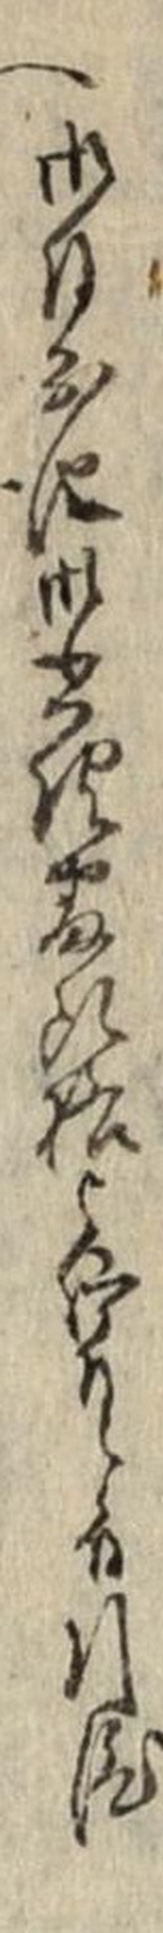御自分儀御書院番頭格被仰付候に付引渡
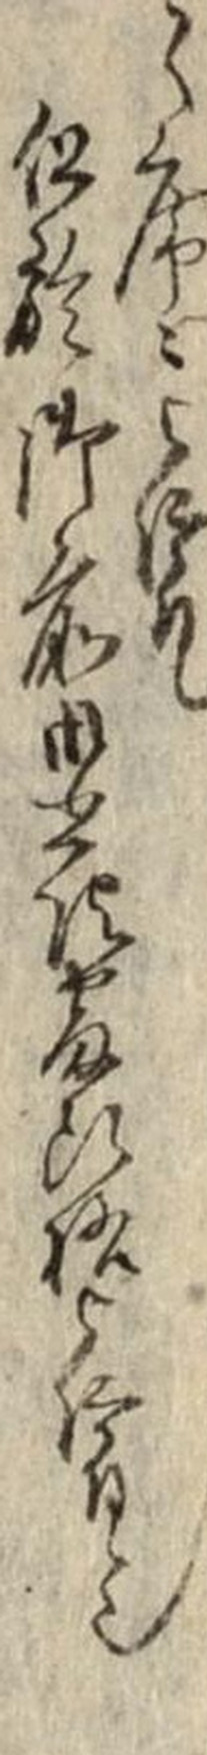但於御前御書院番頭格被仰付候也
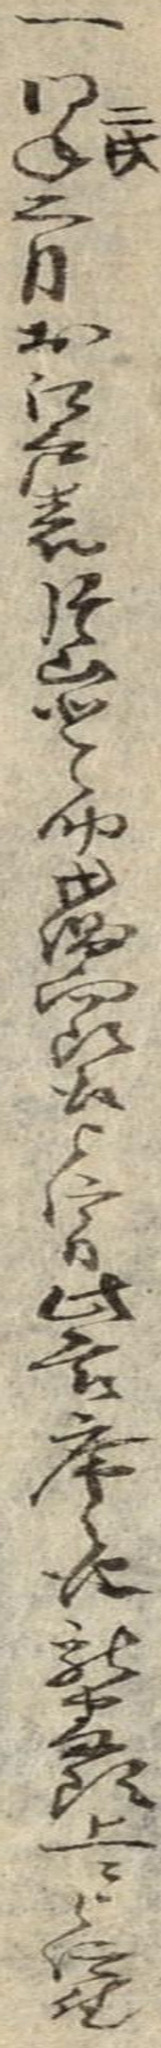一同二戌二月於江戸表片山愛之助御側向頭取被仰付此節席之儀新番頭上に被仰付
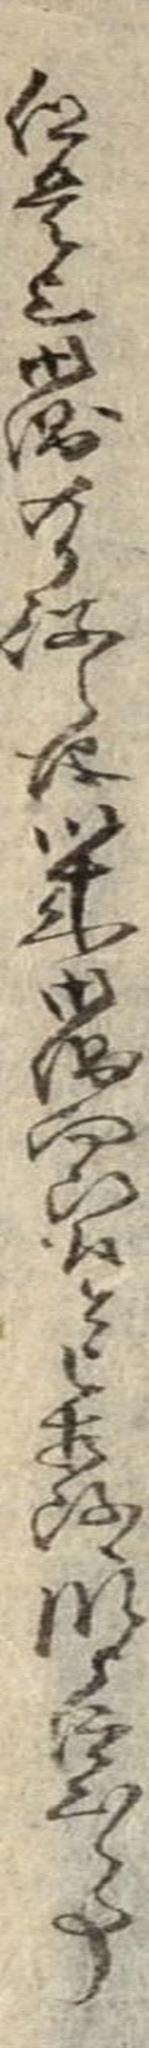但是迄御側〆り役之儀以来御側向頭取と被相改候段被仰出候事
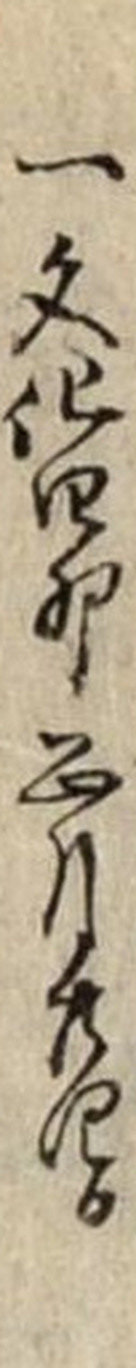一文化四卯正月廿四日
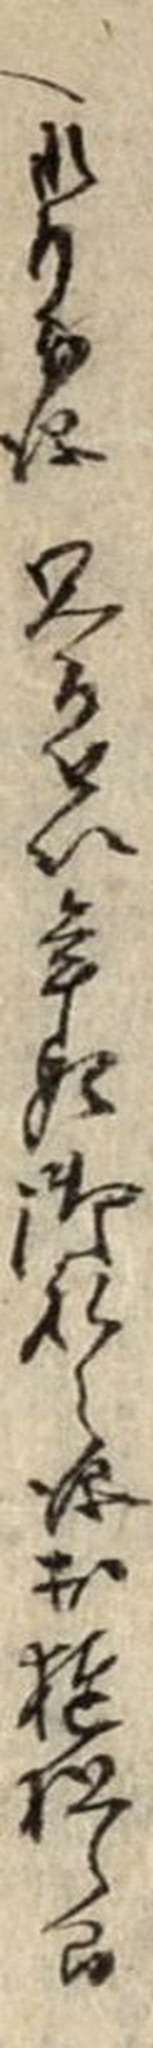御自分儀思召を以年始御礼之儀於韃靼之間
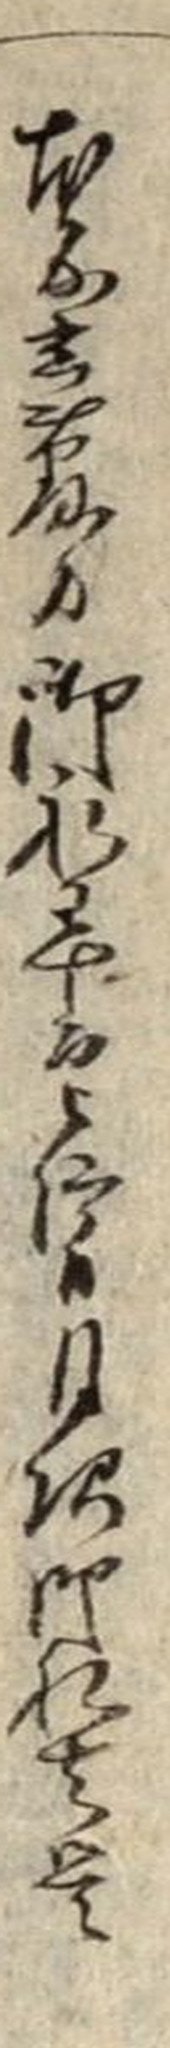本多玄蕃方御礼畢而被仰付月次御礼は是酒井外記
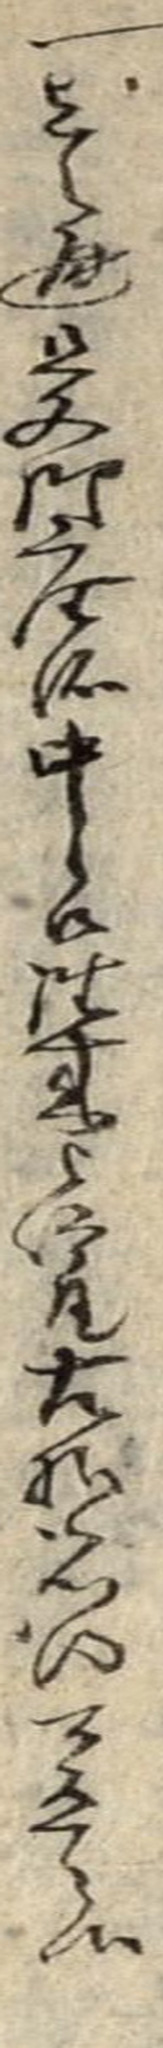迄之通且又御座所中之口往来被仰付候左様御心得可有之候
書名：御用并被仰出之部
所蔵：福井県文書館 Fukui Prefectural Archives
